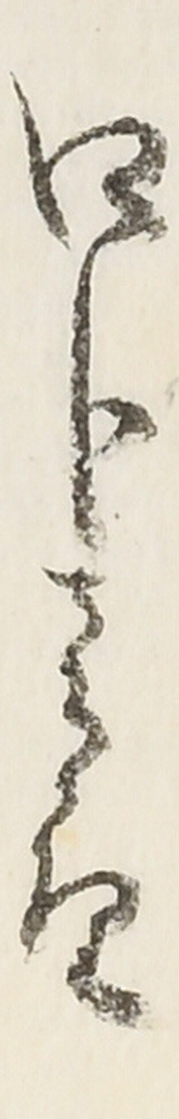四分壱厘
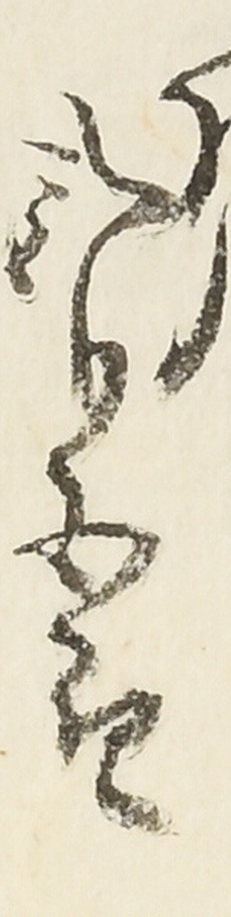弐分五厘
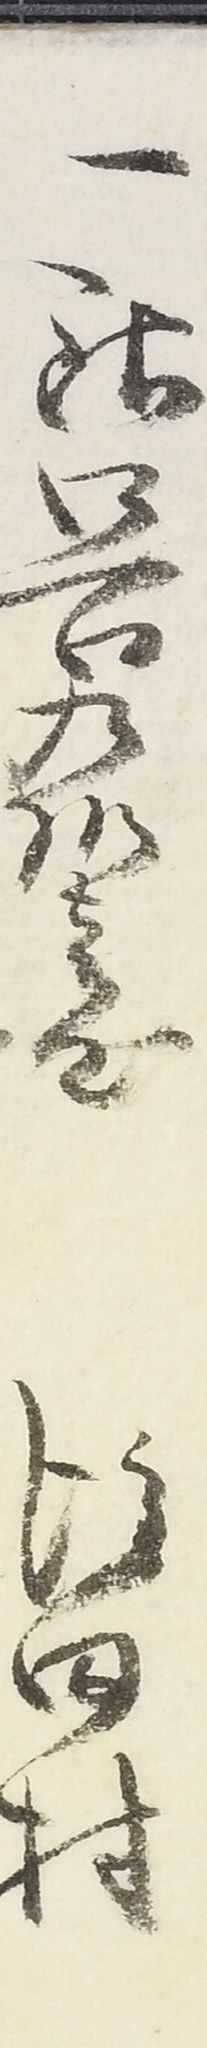一銀四百九拾壱匁塩田村
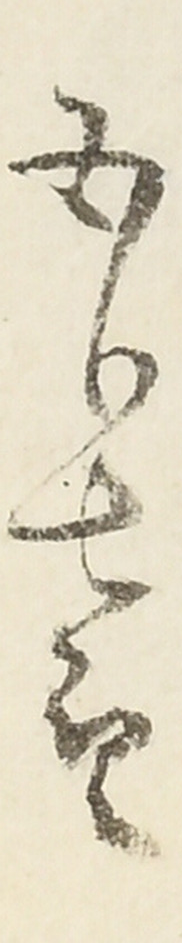五分七厘

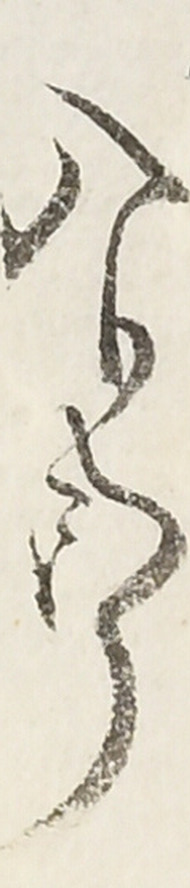八分弐厘
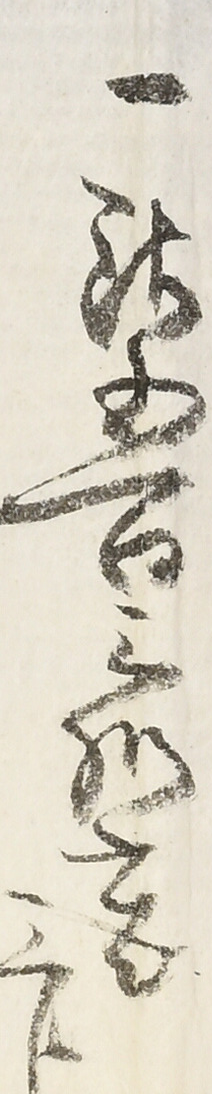一銀五百三拾六匁菅沼村
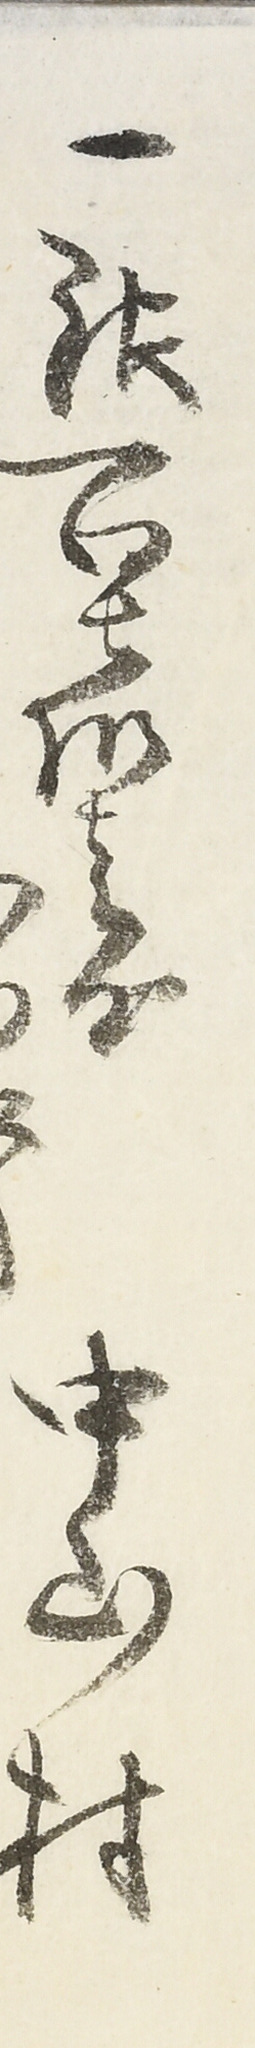一銀百七拾壱匁中山村
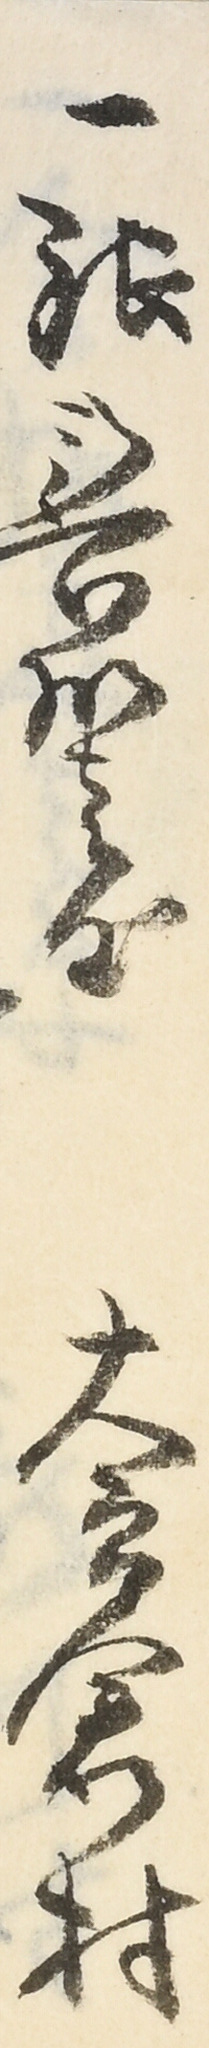一銀弐百拾壱匁大曽倉村
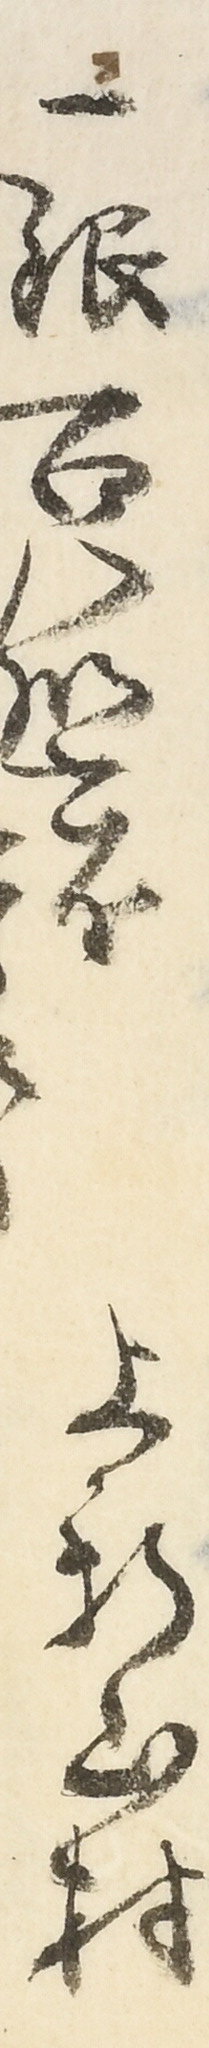一銀百八拾六匁上新山村

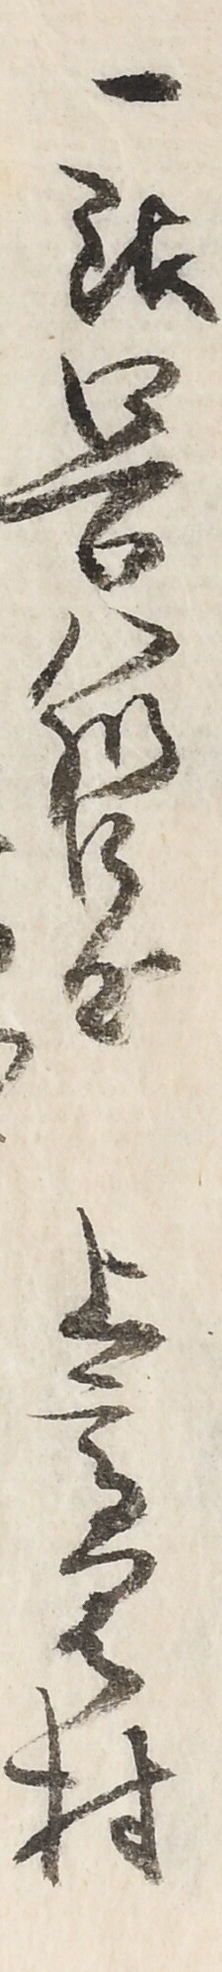一銀四百八拾四匁上高見村
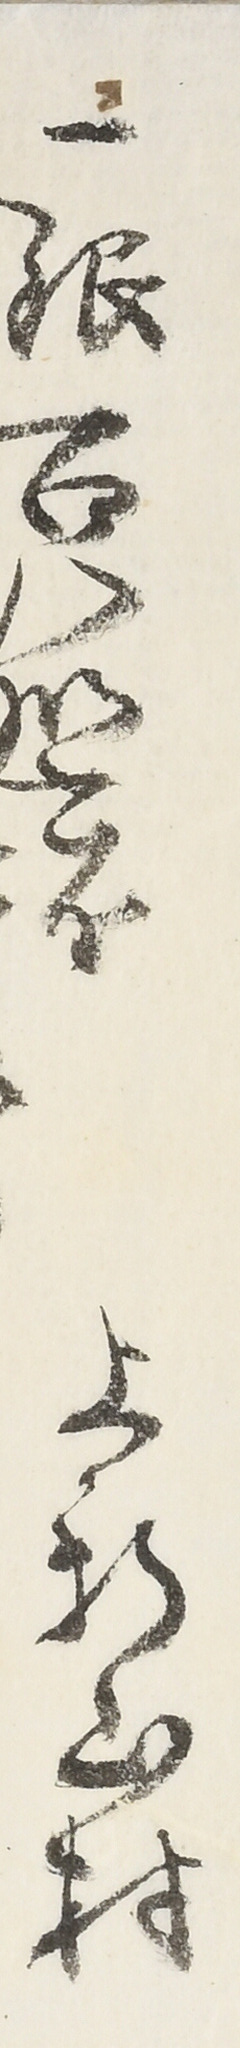一銀百八拾六匁上新山村
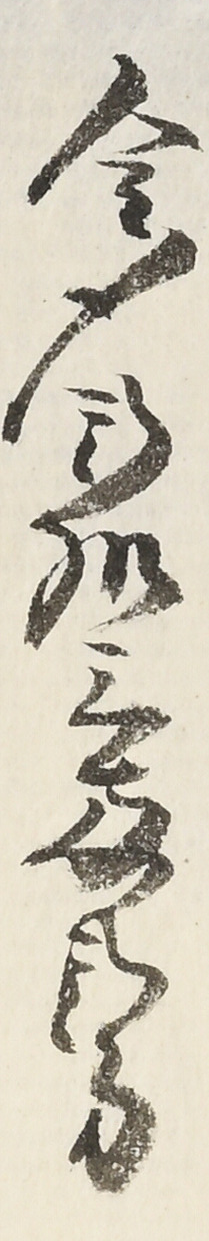金〆弐拾三両弐分
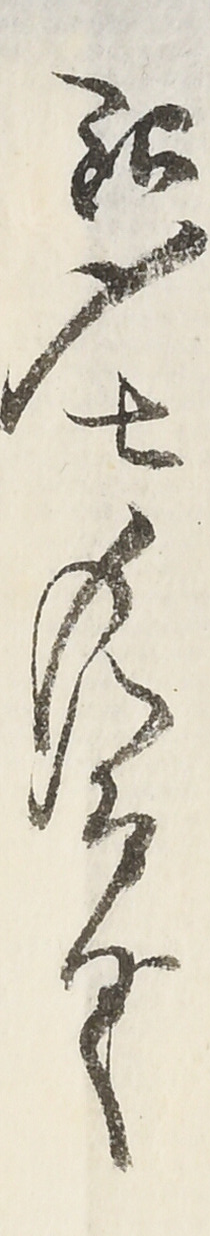銀〆七〆八百匁
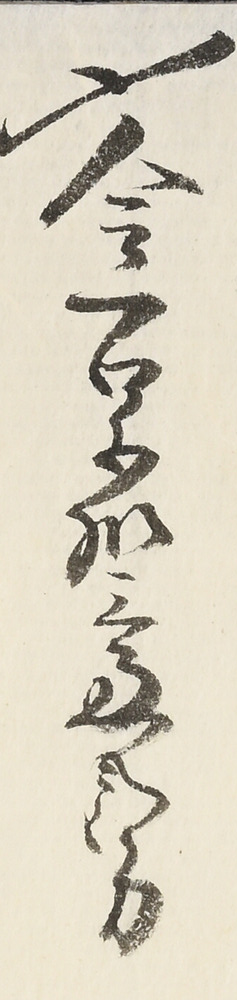〆金百五拾三両荷分
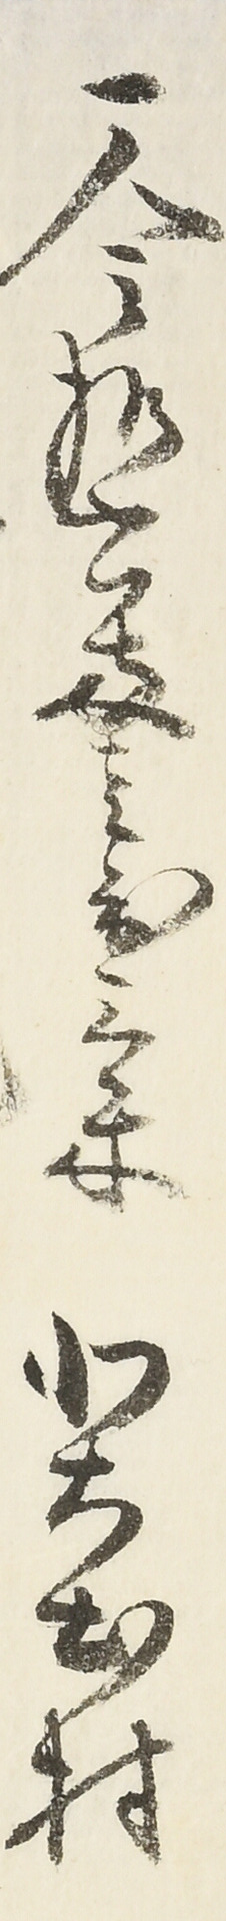一金拾六両壱分三朱北大出村
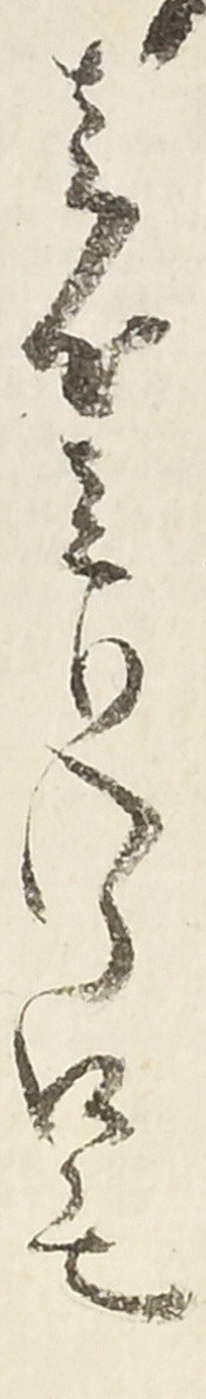壱匁壱分八厘四毛
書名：在町帯刀献金割帳
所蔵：伊那市立高遠町図書館・合同会社AMANE
